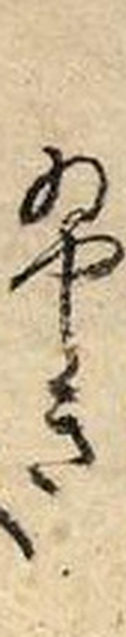ゐやしき
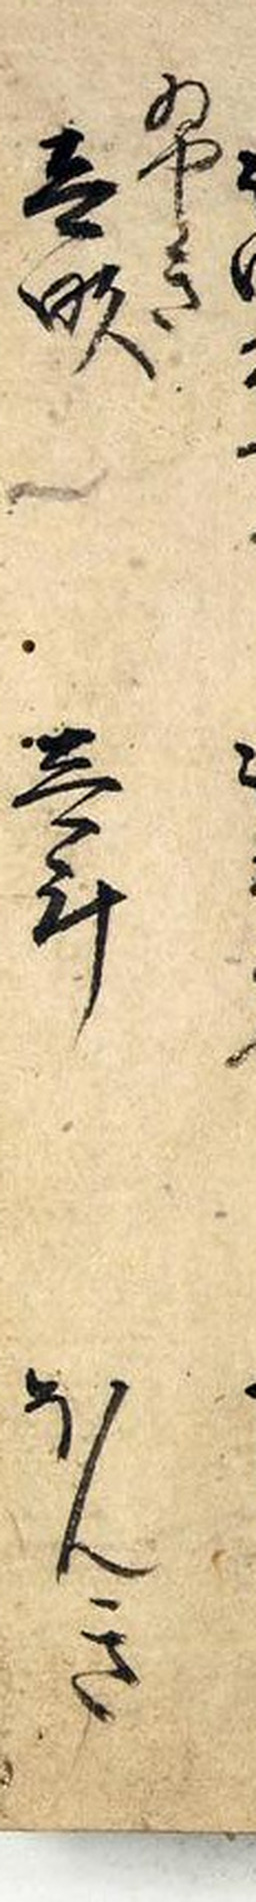壱畝壱斗ほんき

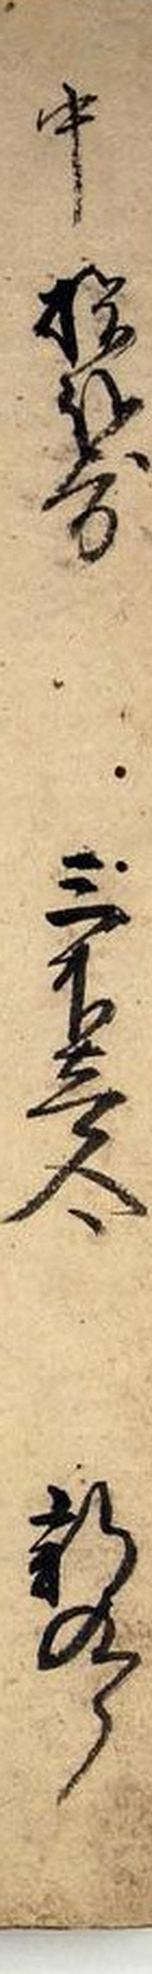中拾弐歩三升壱合新九郎
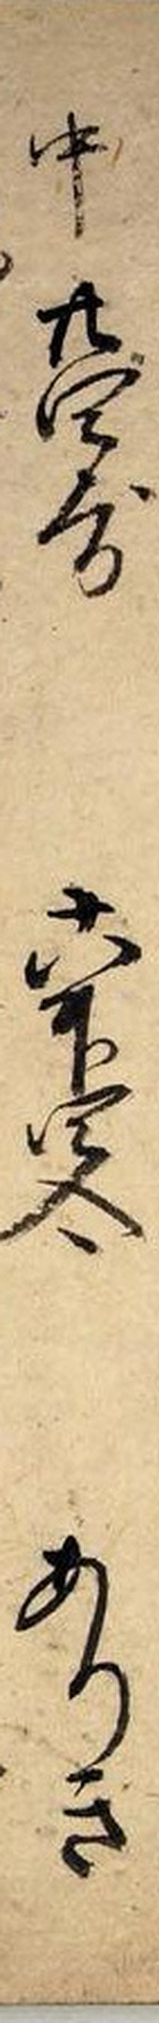中廿四歩六升四合ありき
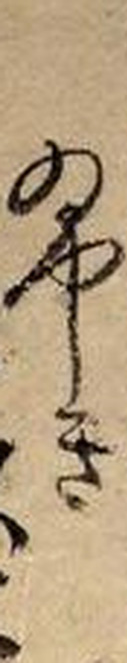ゐやしき
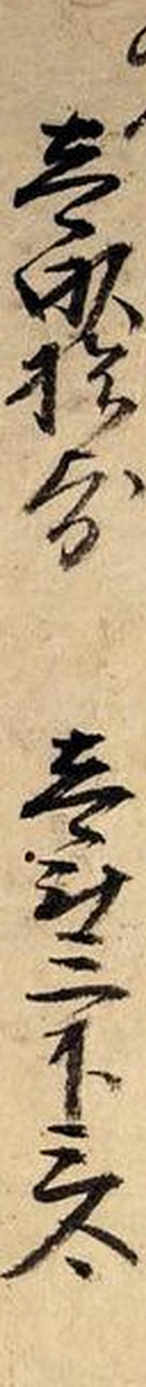壱畝拾歩壱斗三升三合同人
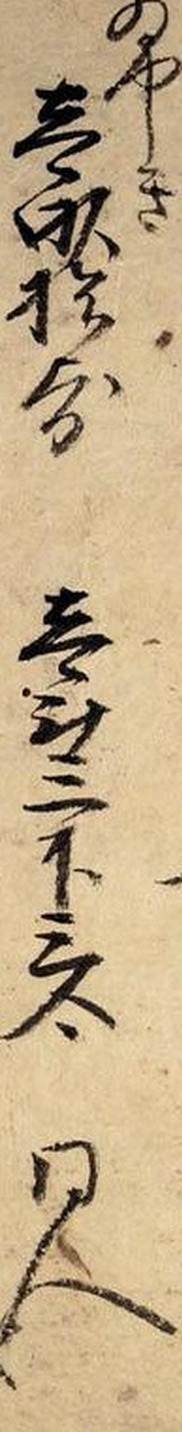壱畝拾歩壱斗三升三合同人
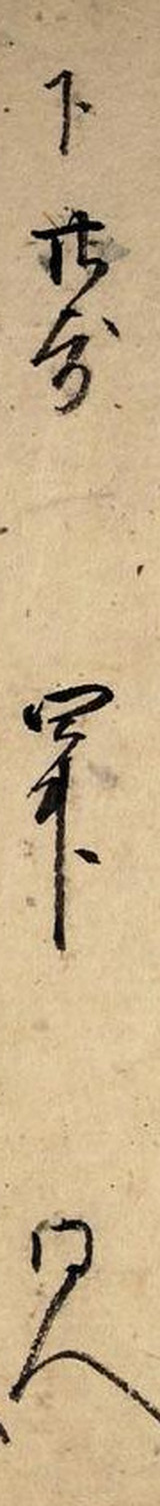下廿歩四升同人
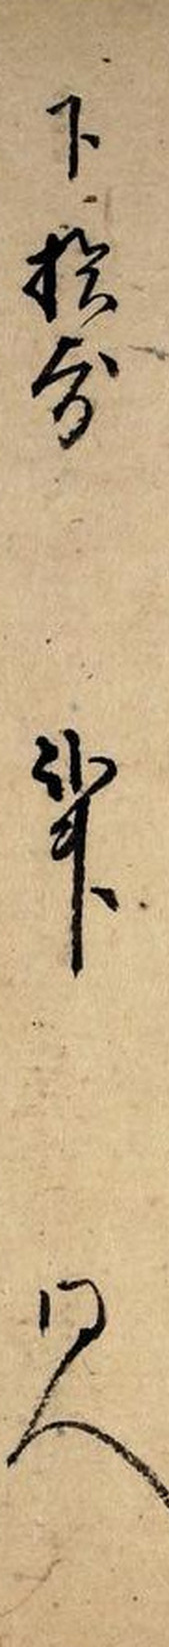下拾歩弐升同人
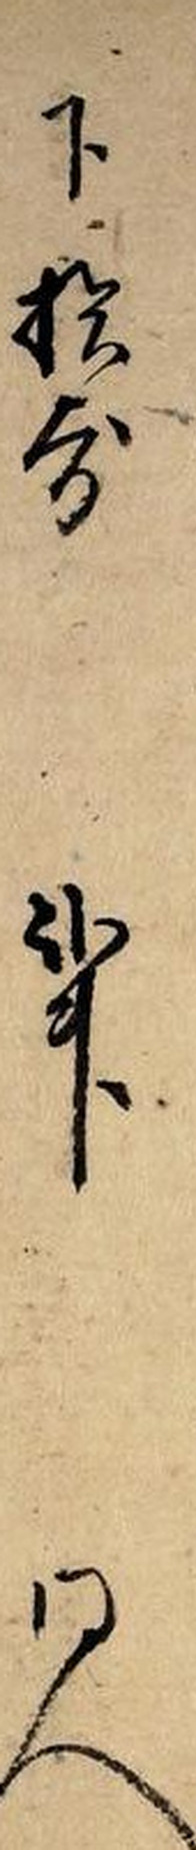下拾歩弐升同人
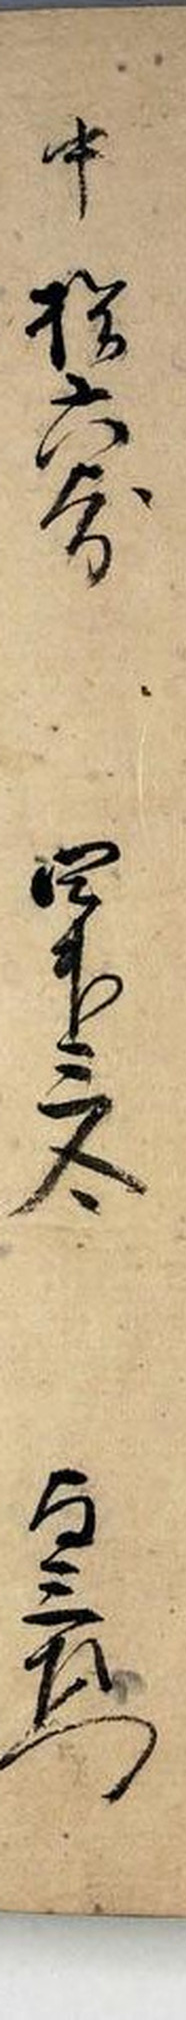中拾六歩四升三合与三左衛門
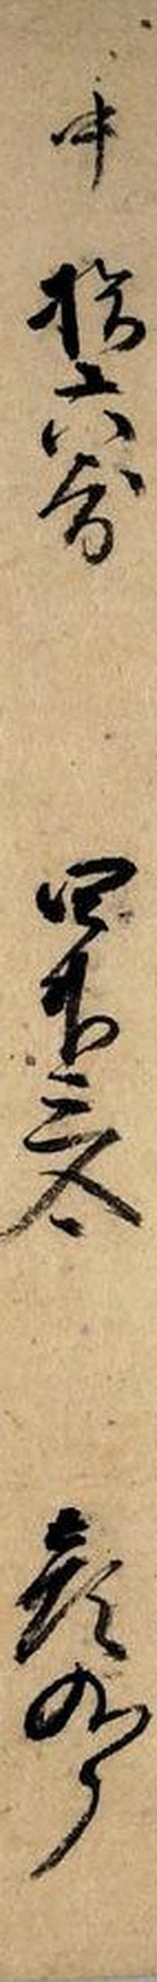中拾六歩四升三合彦九郎
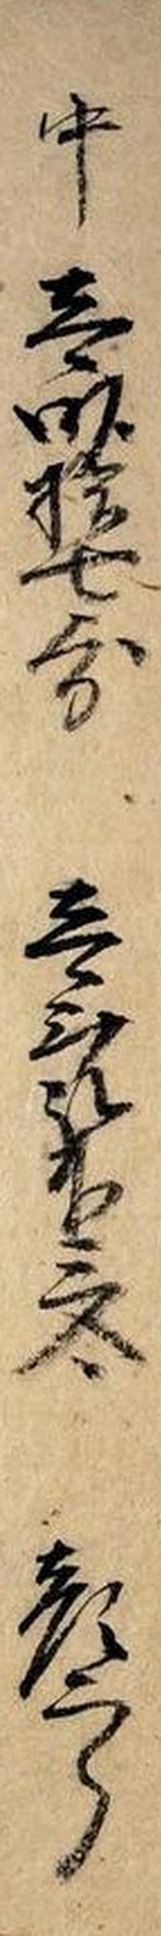中壱畝拾七歩壱斗弐升三合彦二郎
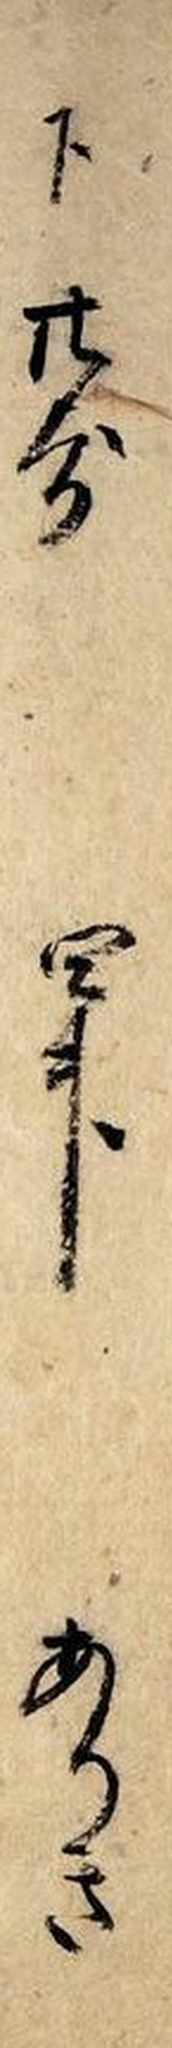下廿歩四升ありき
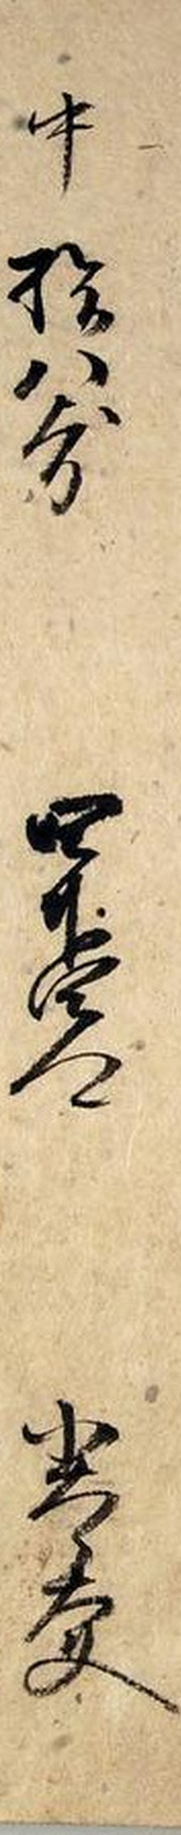中拾八歩四升四合小大郎大夫
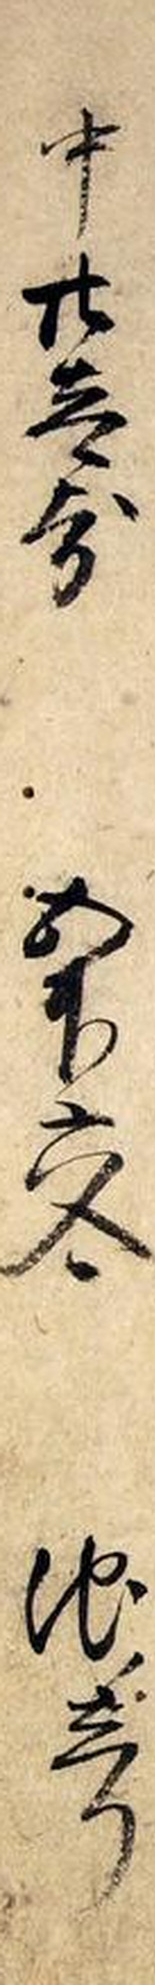中廿壱歩五升六合池ノしり
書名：若州三方郡之内世久見浦御検地帳（世久見浦検地帳写）
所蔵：福井県文書館 Fukui Prefectural Archives
